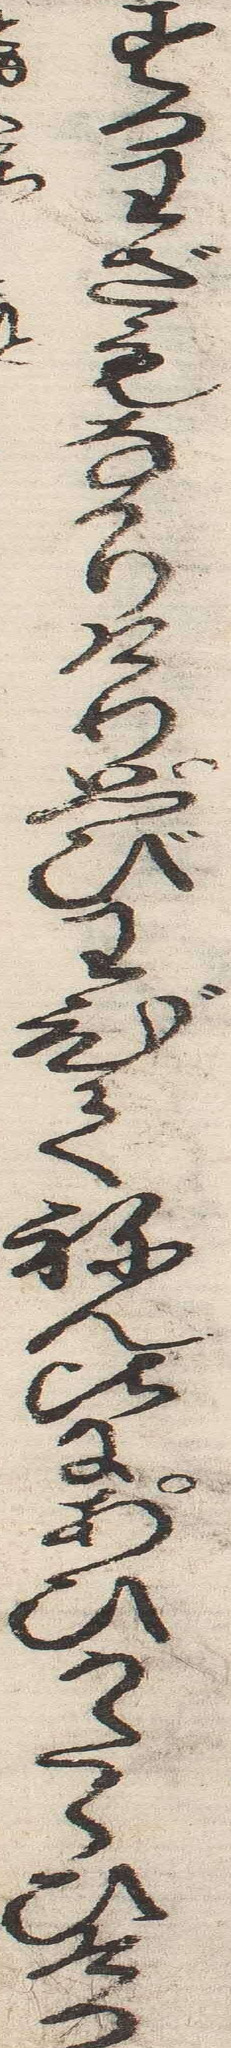するわざもなかりけり。思びわびてねん比に。あひかたらひける
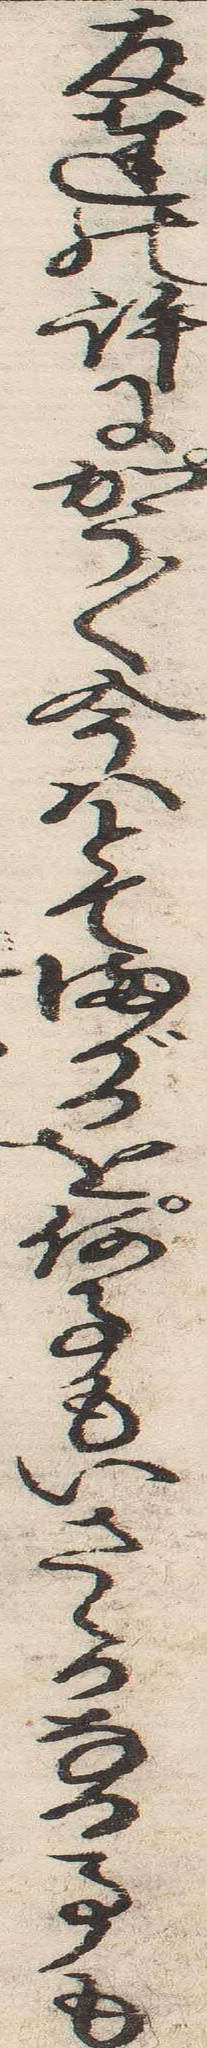友達の許に。かう〳〵今はとてまがるを。何事もいさゝかなる事も
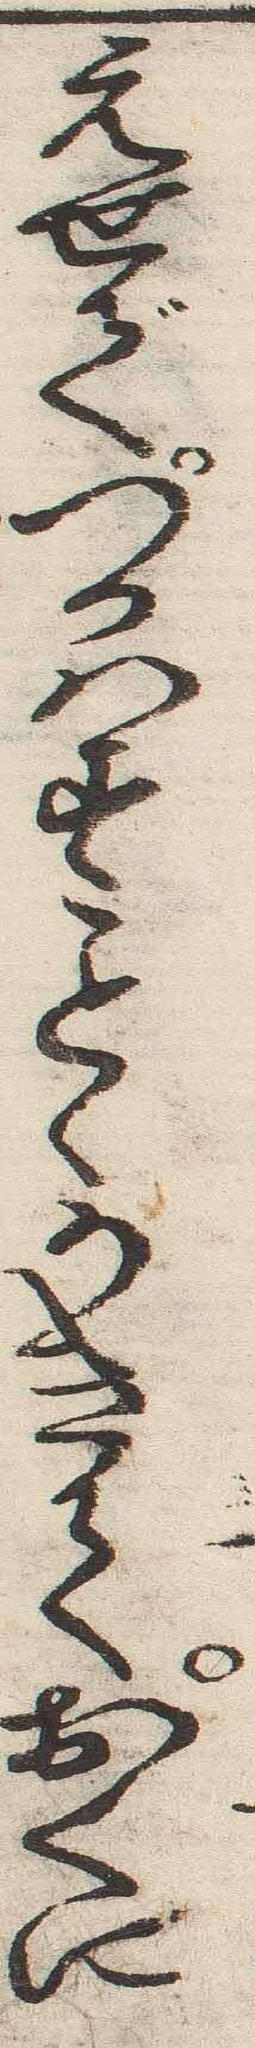えせで。つかはすことゝかきて。おくに
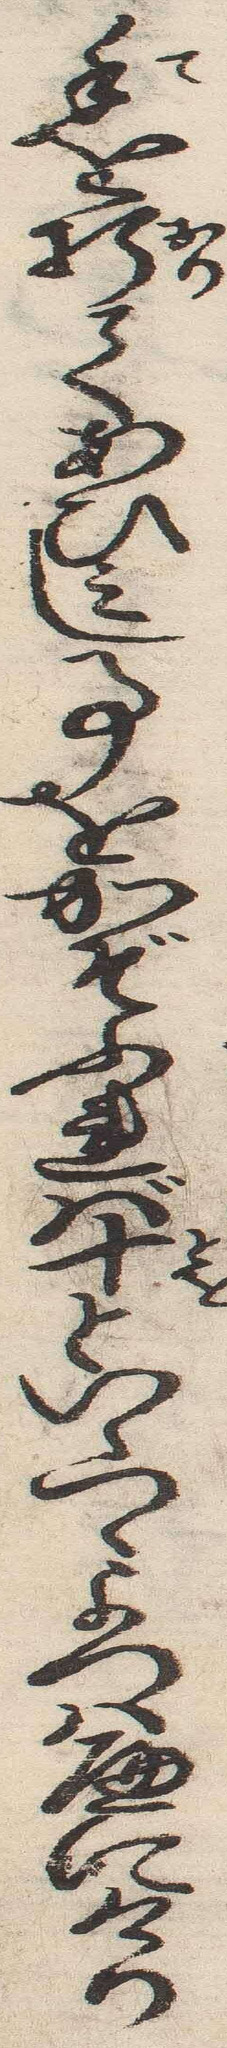手を折てあひみし事をかぞふれば十といゝつゝよつはへにけり

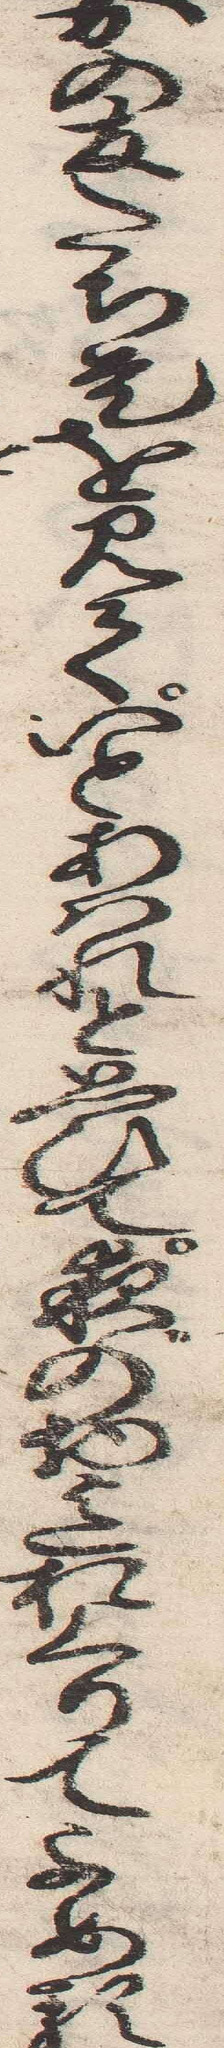かの友たち是を見て。いとあはれと思ひて。夜。の物迄おくりてよめる
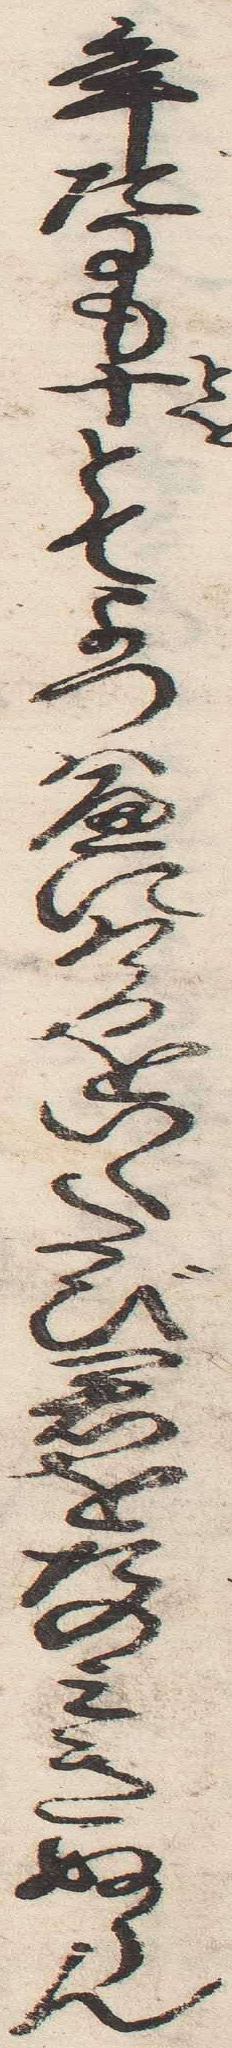年たにも十とてよつはへにけるをいくたび君をたのみきぬらん
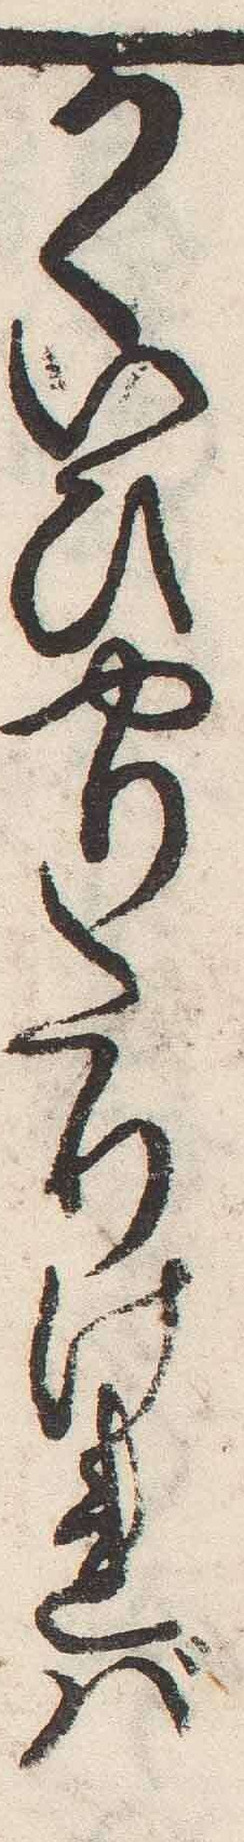かくいひやりたりければ
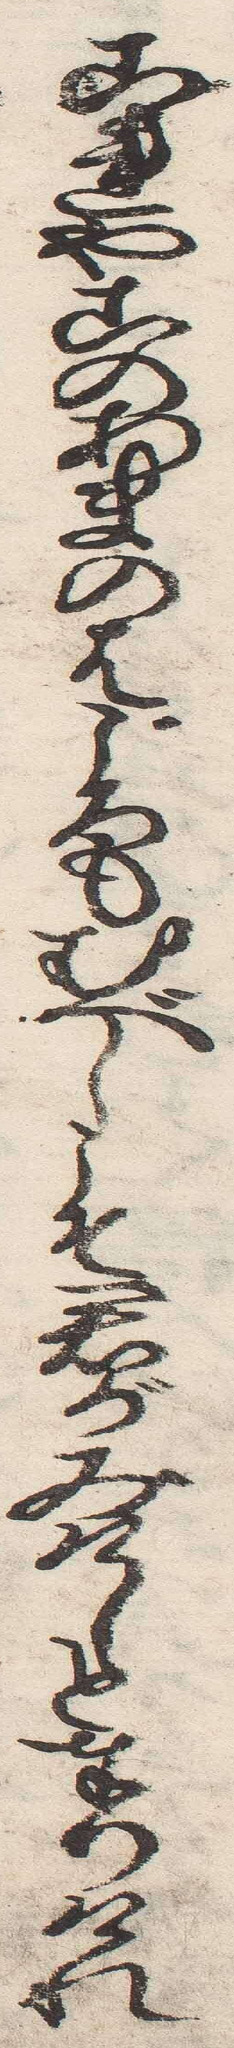これやこのあまのはごろもむべしこそ君がみけしと奉りけれ
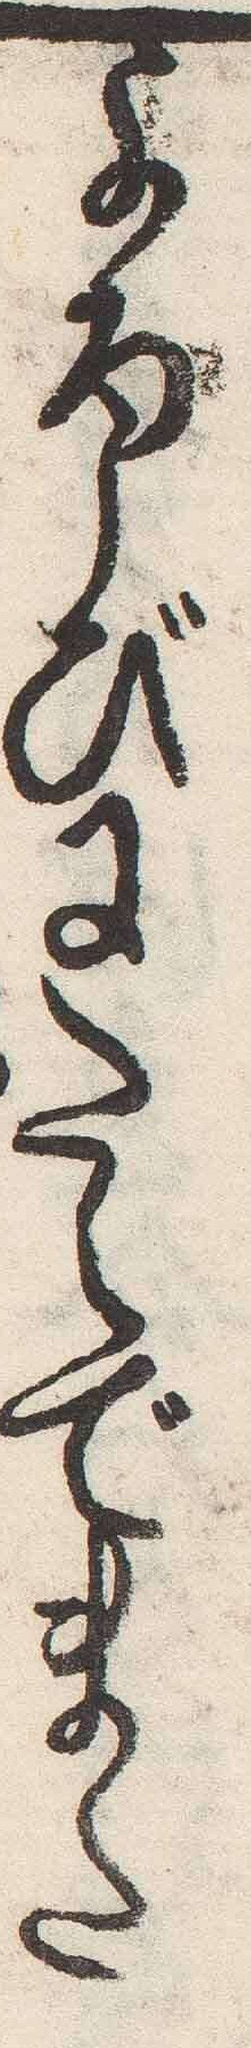よろこびにたえでまた
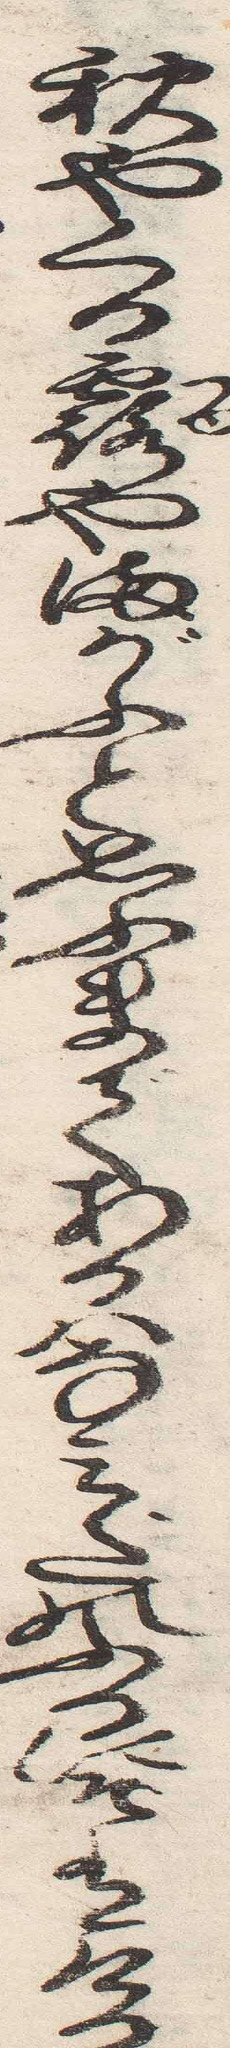秋やくる露やまがふと思ふまであるはなみだのふるにそ有ける
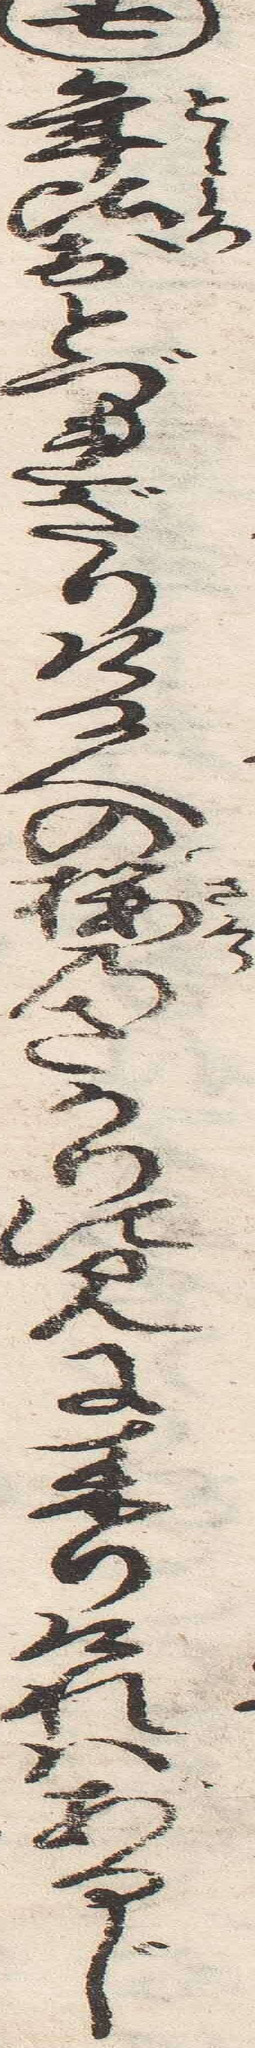十七年比おとづれざりける人の桜のさかりに見に来りけれはあるじ
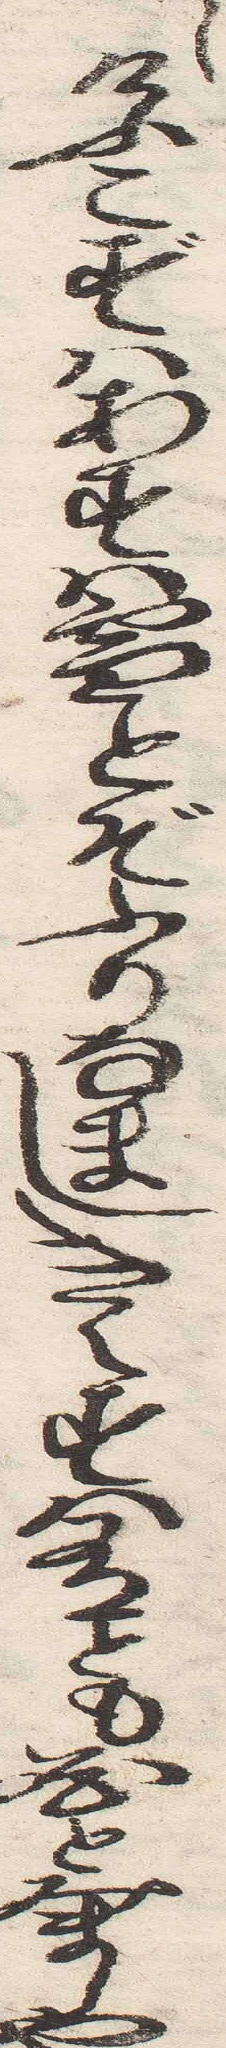けふこずはあすは雪とぞふりなましきえすは有とも花とみましや
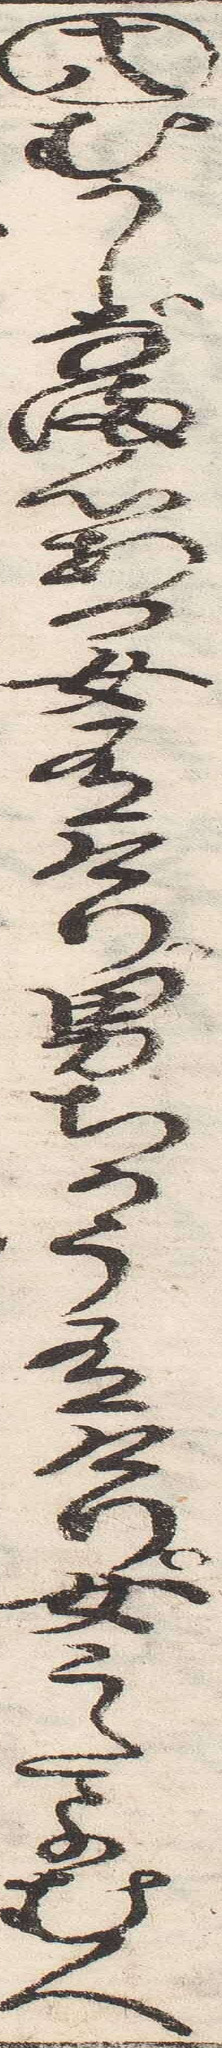十八むかし。なま心ある女有けり。男ちかう有けり。女うたよむ人
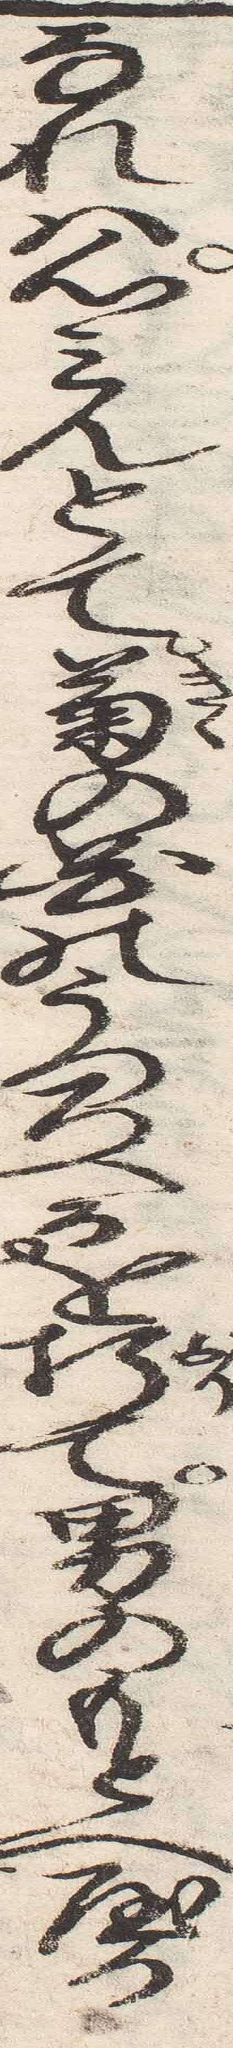なれは。心みんとて。菊の花のうつろへるを折て。男のもとへやる
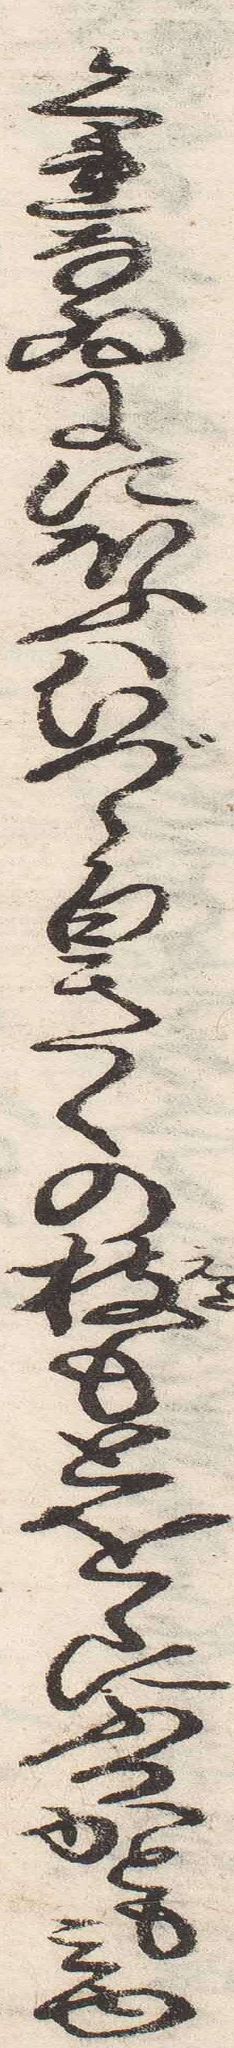くれなゐにほふはいづら白きくの枝もとをゝにふるかともみゆ
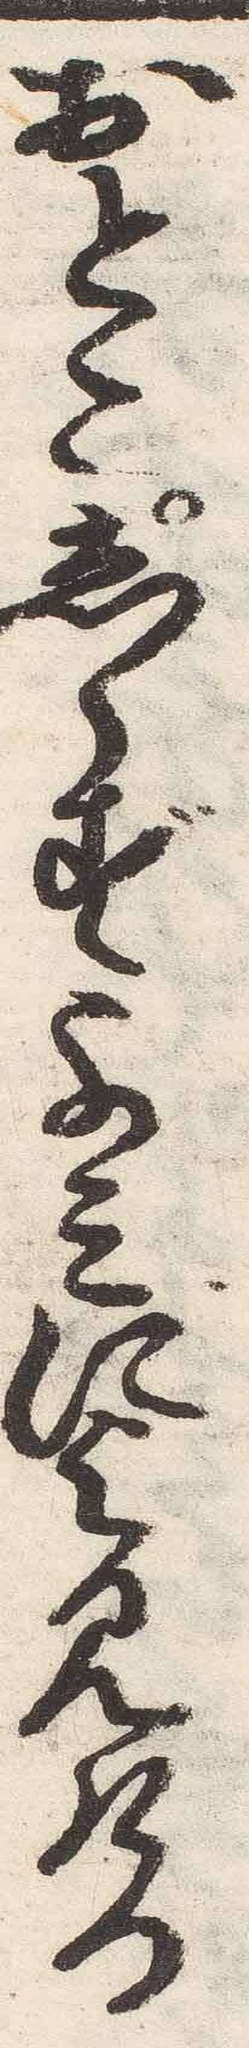おとこ。しらずよみによみける
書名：伊勢物語
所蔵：東京学芸大学附属図書館 国文学研究資料館
